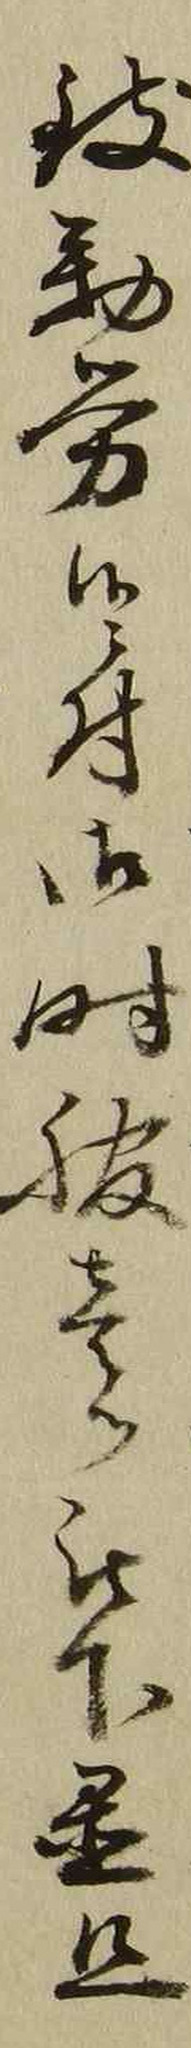致勤労候ニ付御時服壱ツ被下置且
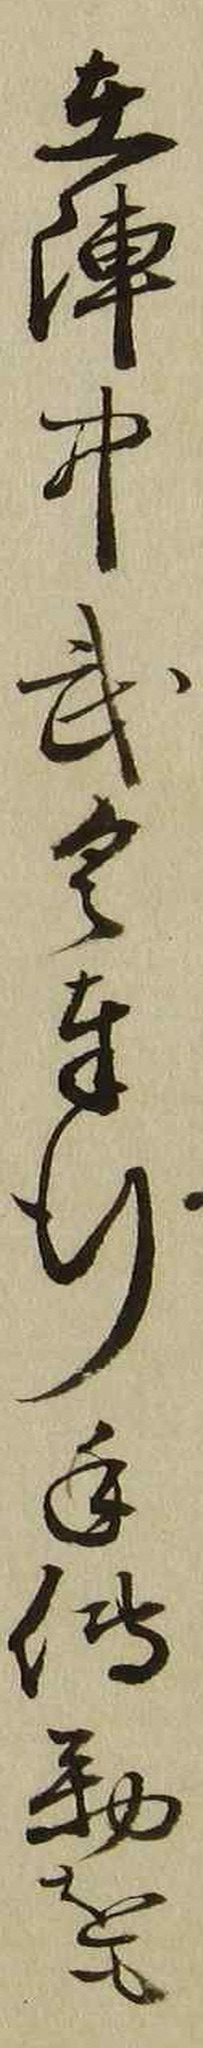在陣中武具奉行手伝勤をも
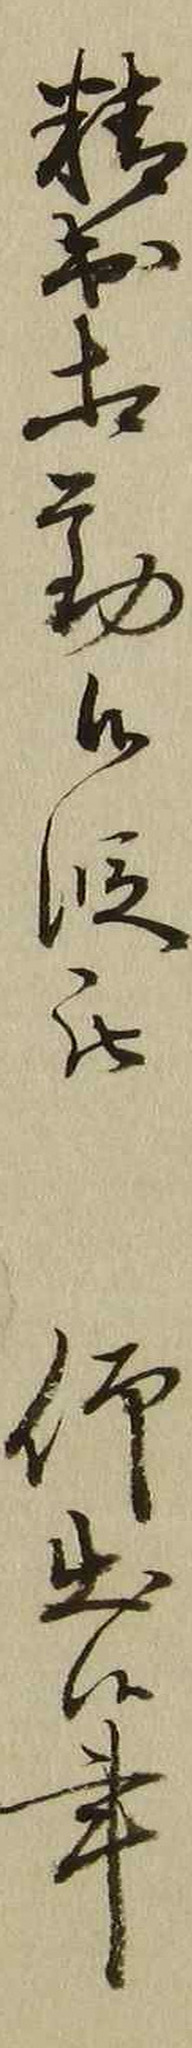精出相勤候段被仰出候事
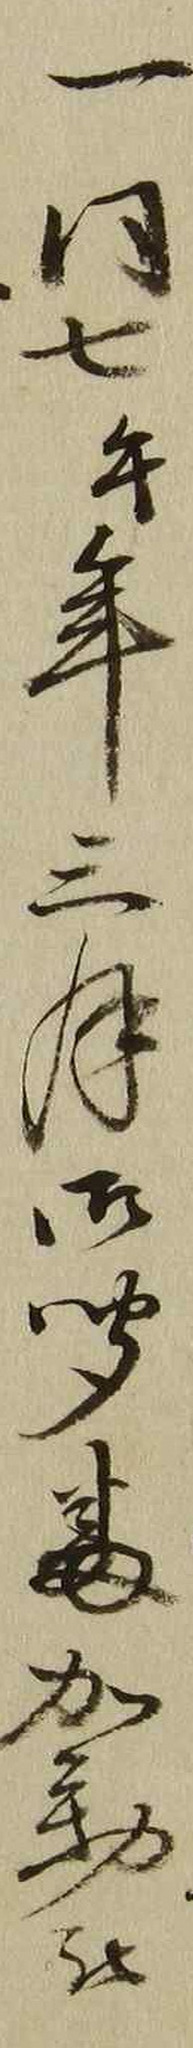一同七午年三月御聞番加勤被
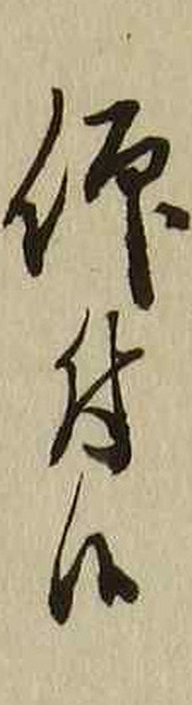仰付候
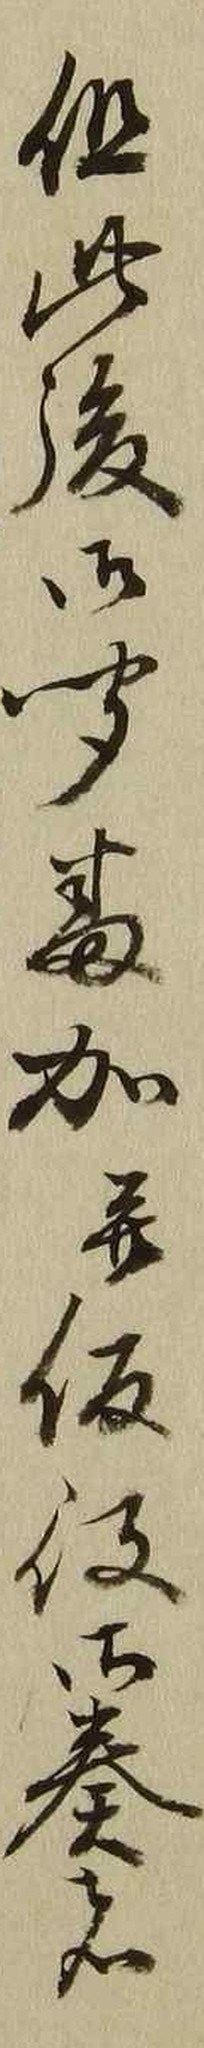但此後御聞番加并仮役御奏者
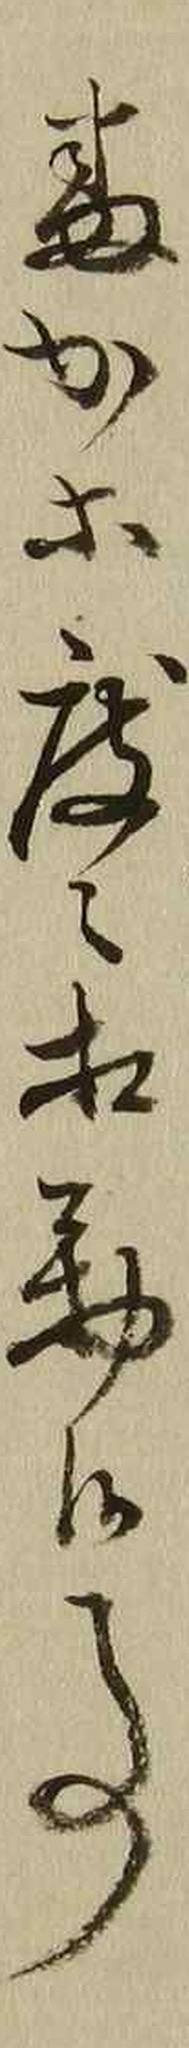番加等度々相勤候事
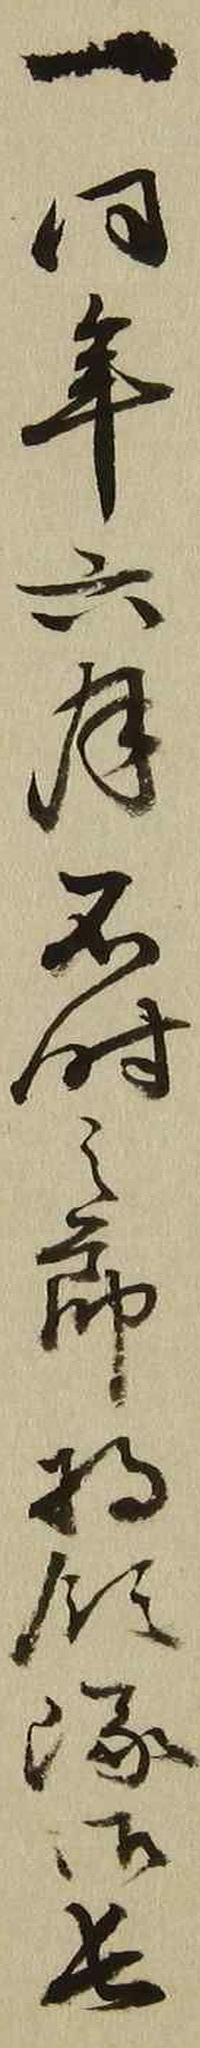一同年六月不時之節将領隊御長
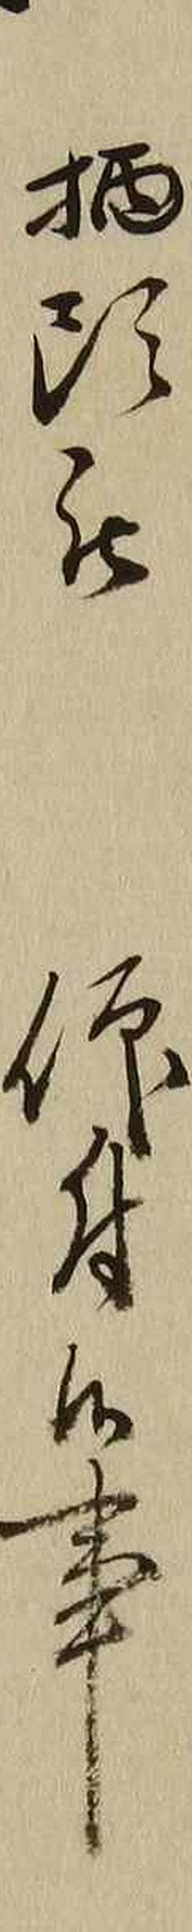柄頭被仰付候事
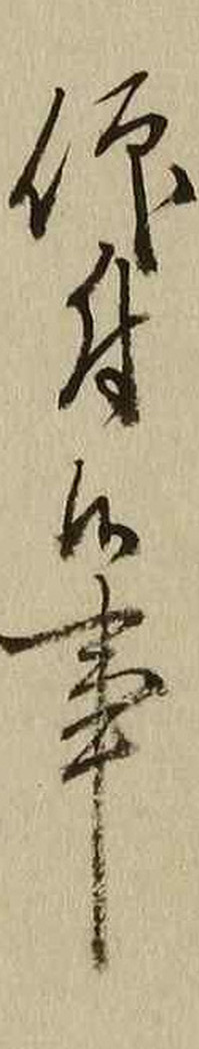仰付候事
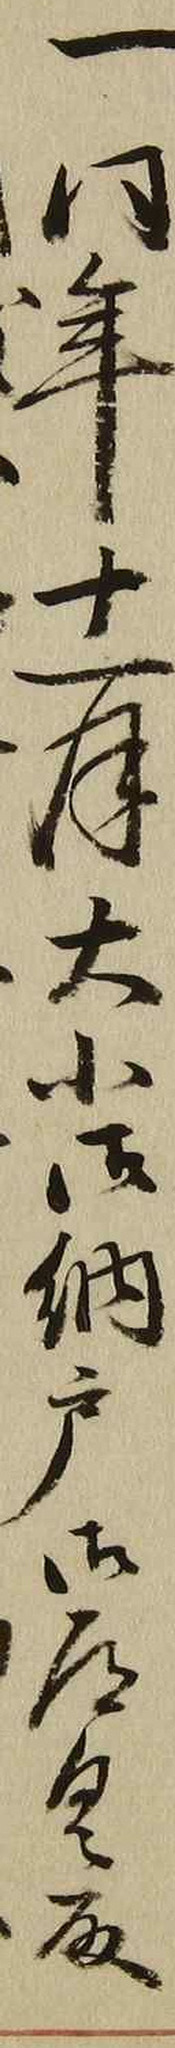一同年十一月大小御納戸御道具取
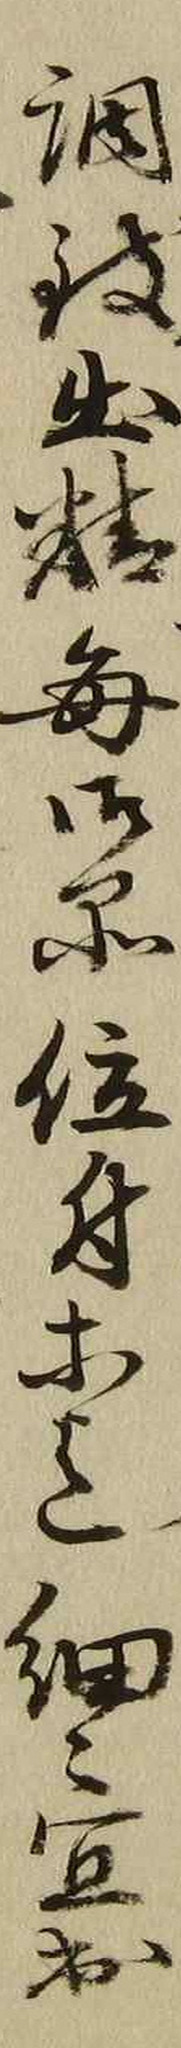調致出精毎御品位付等迄細々宜出
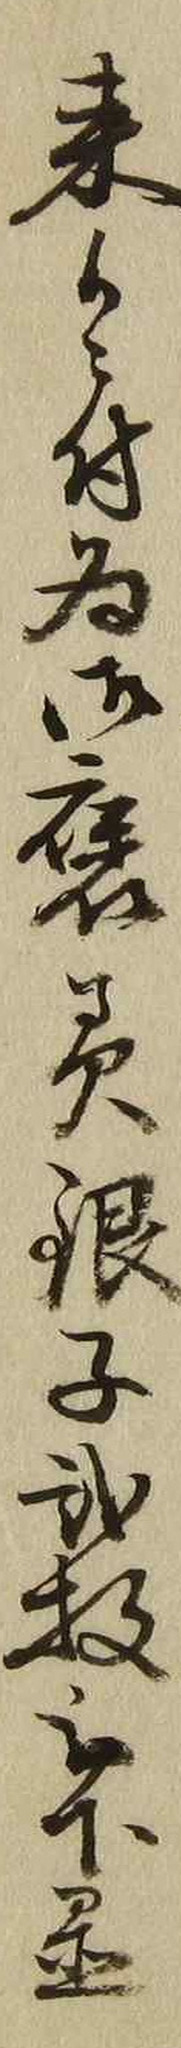来候ニ付為御褒美銀子弐枚被下置
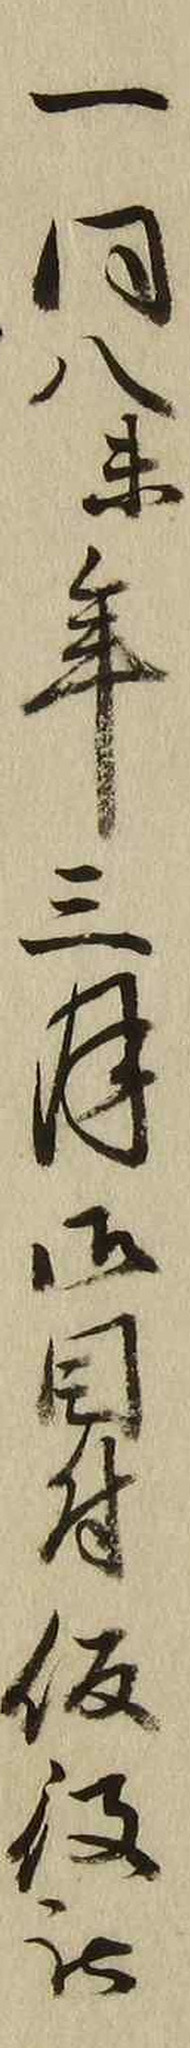一同八未年三月御目付仮役被
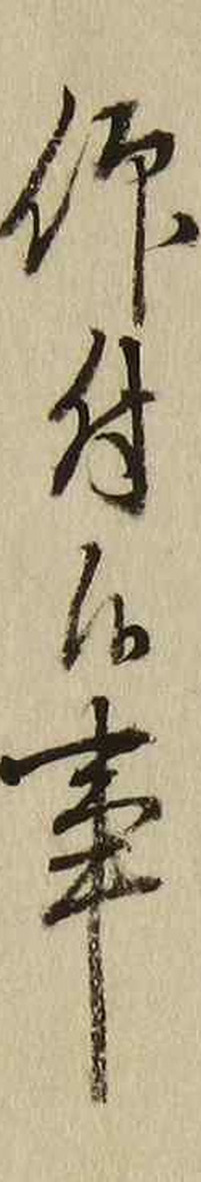仰付候事
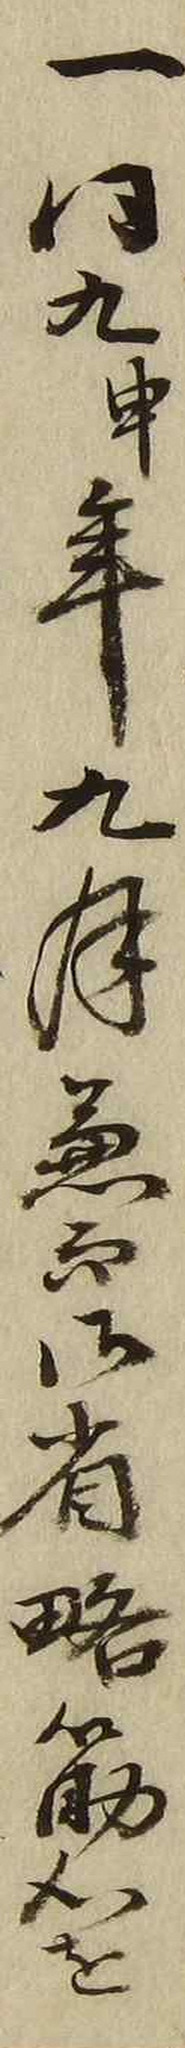一同九申年九月兼而御省略筋心を
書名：諸士系譜　巻之35　は之部3
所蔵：会津若松市立会津図書館
